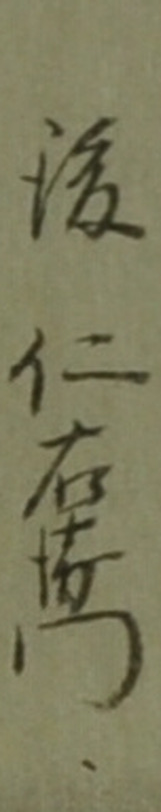後仁右衛門
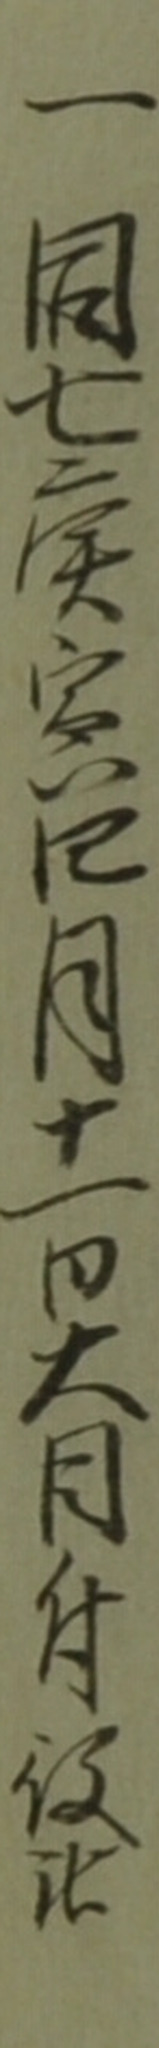一同七庚寅四月十一日大目付役被
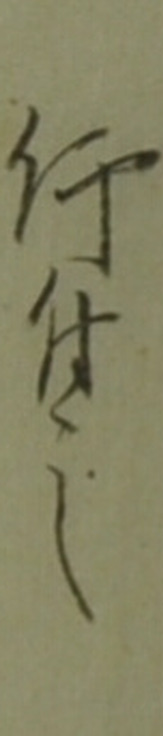仰付之
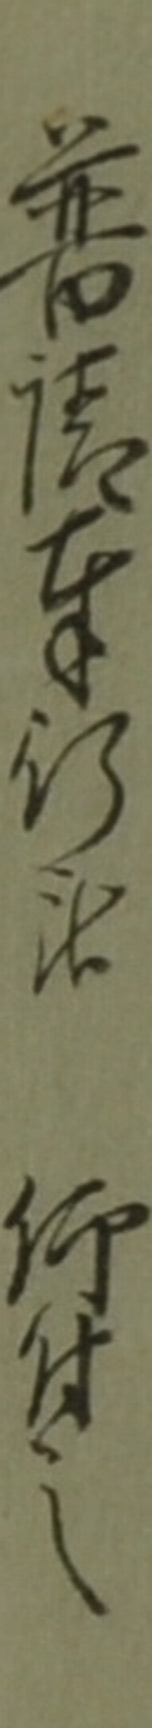普請奉行被仰付之

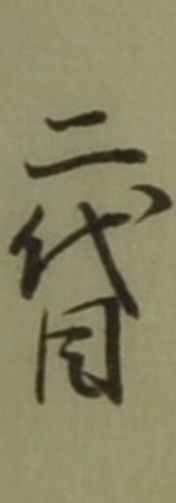二代目
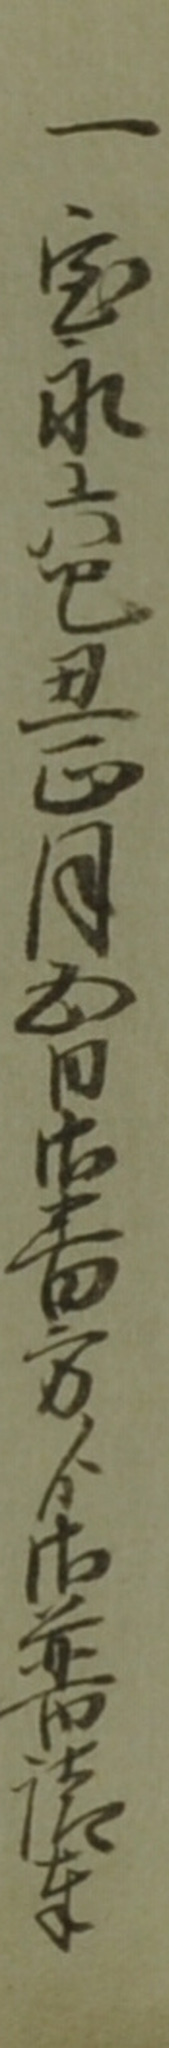一宝永六己丑正月五日御番方ゟ御普請奉
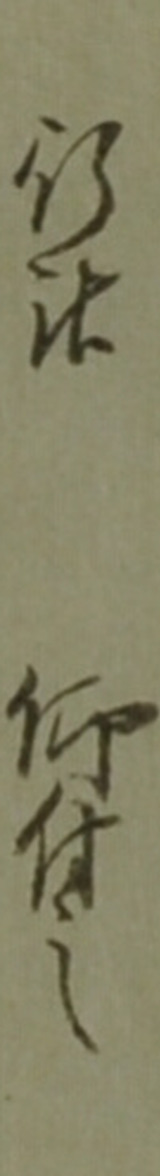行被仰付之
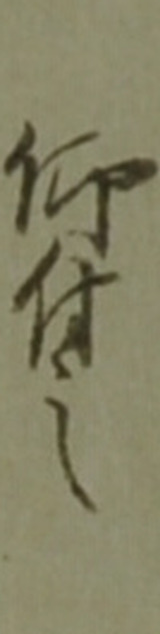仰付之
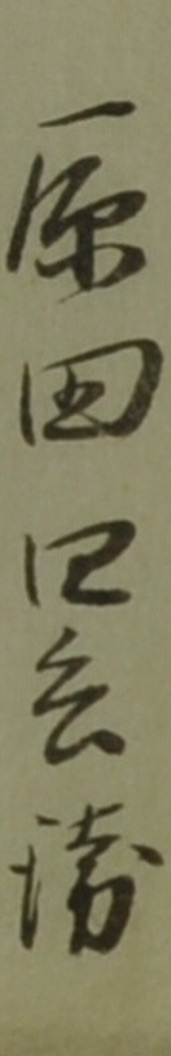原田四兵衛
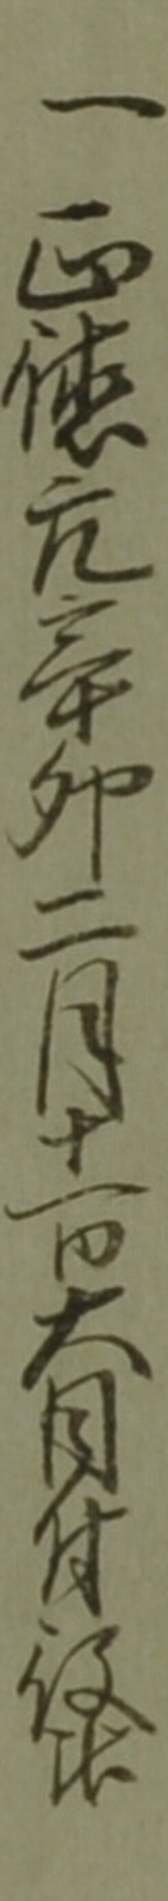一正徳元辛卯二月十一日大目付役被
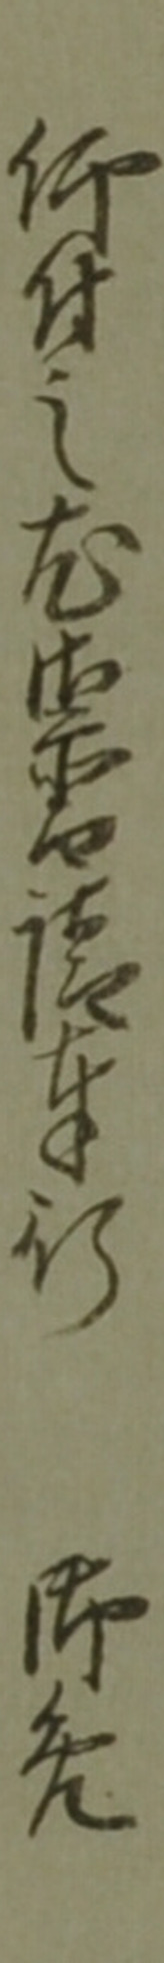仰付之尤御普請奉行御免
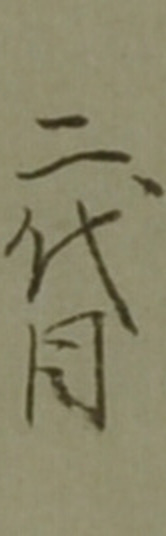二代目
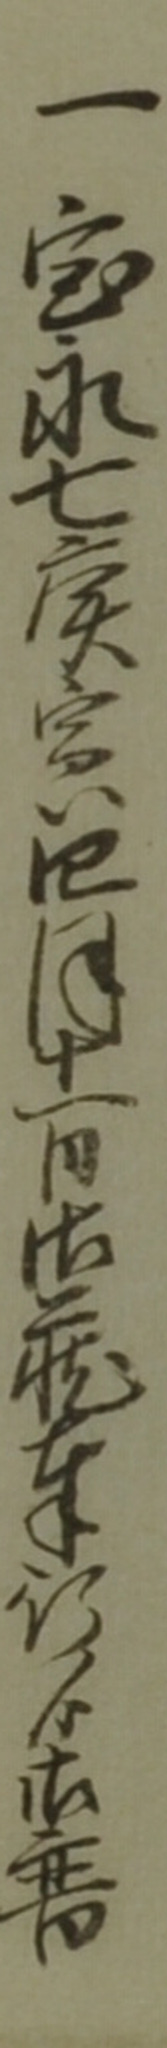一宝永七庚寅四月十一日御蔵奉行ゟ御普
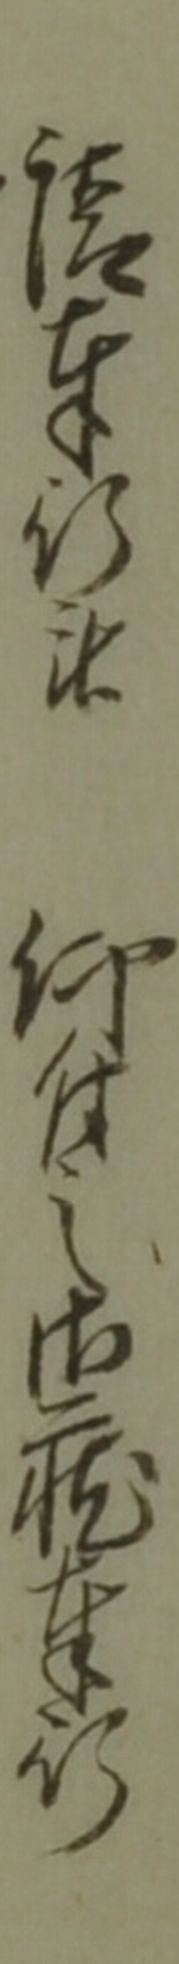請奉行被仰付之御蔵奉行
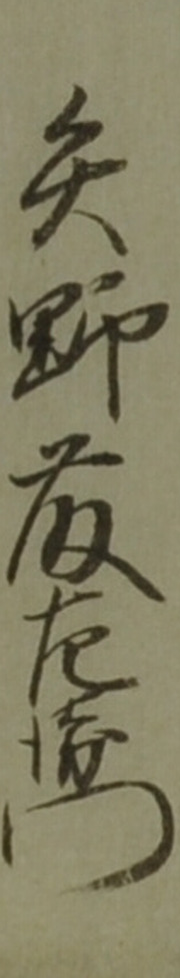矢野藤左衛門
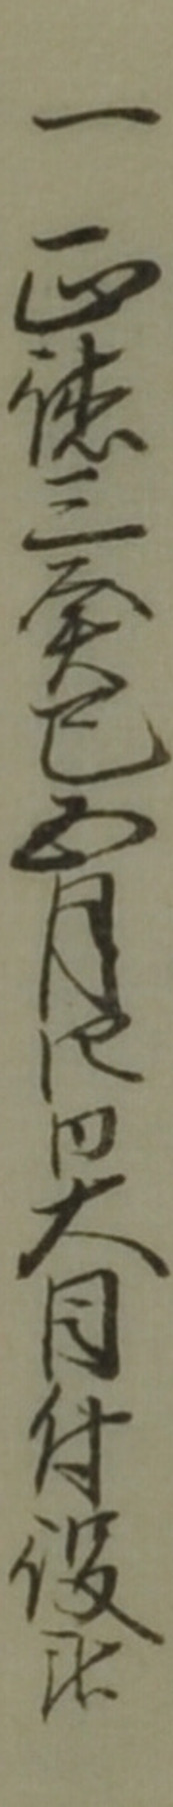一正徳三癸巳五月四日大目付役被
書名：諸御役代々録（六）
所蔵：伊那市立高遠町図書館・合同会社AMANE
